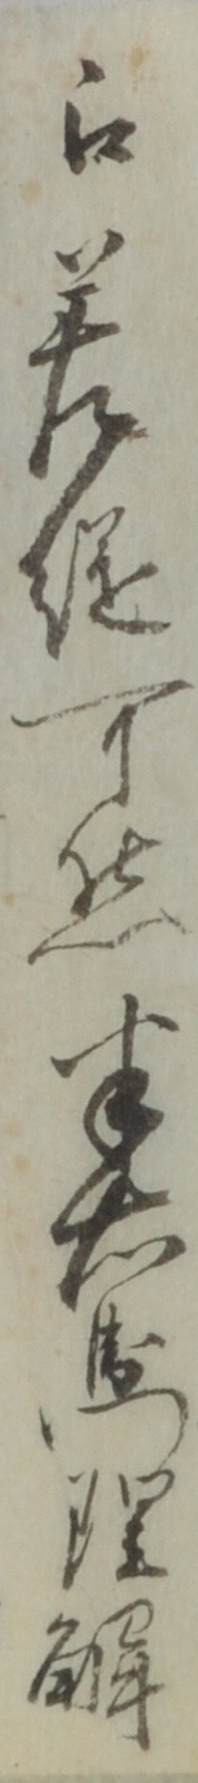え差継可然半右衛門理解

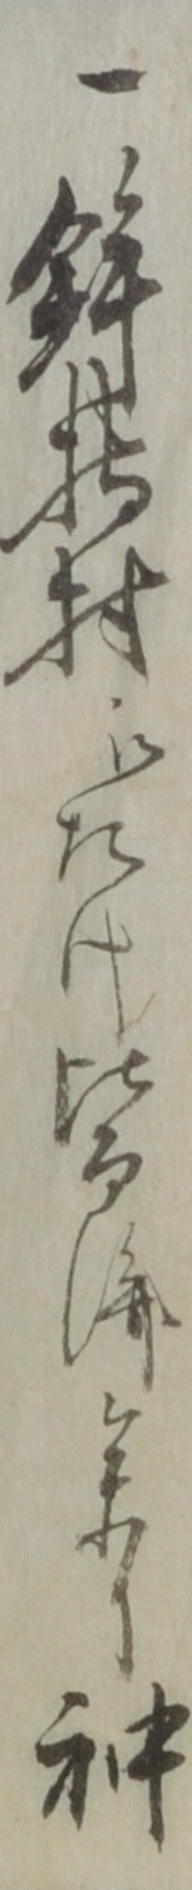一鉾持村えたけ皆済参り神
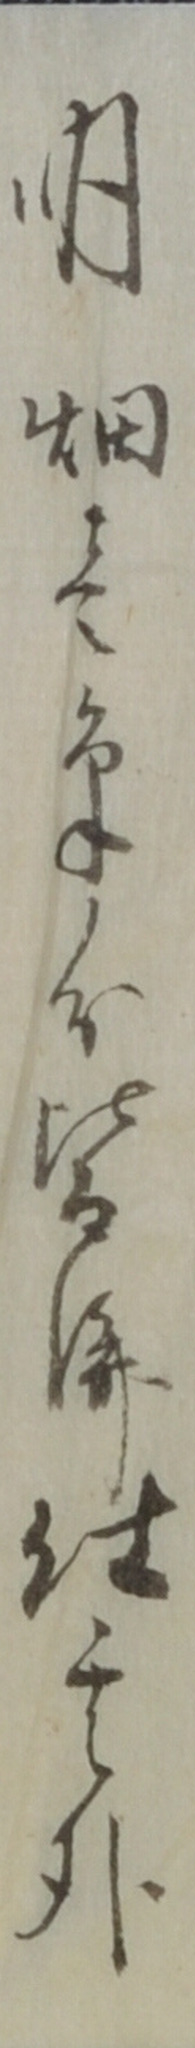明畑壱筆分皆済仕其外
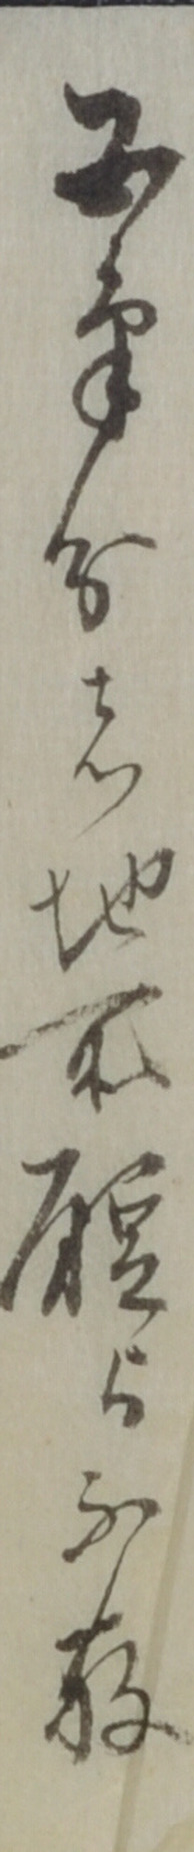五筆分は地所聢と不存
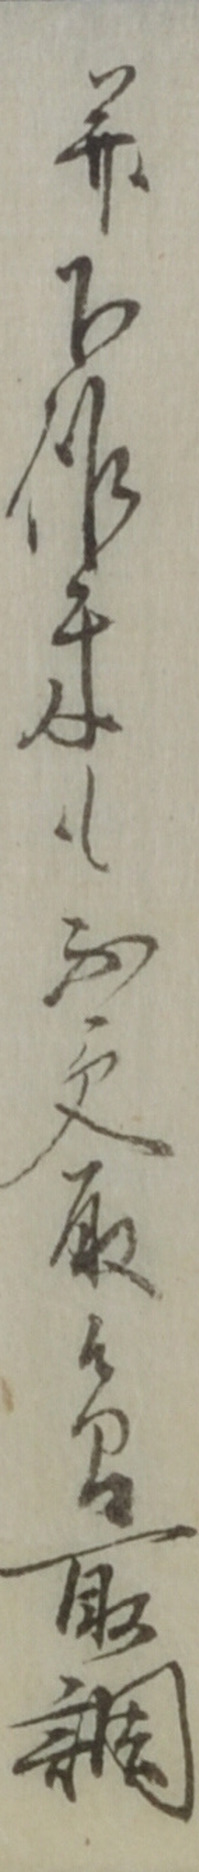幷下作米も不受取候間取調
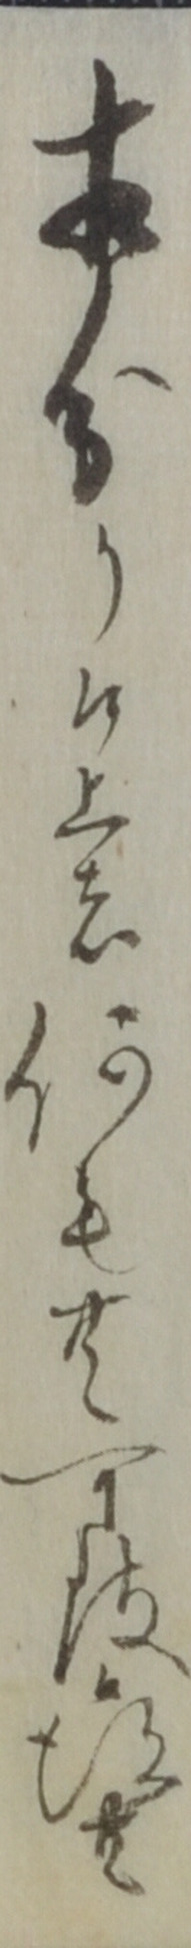相分り候上は何も共可致候得共
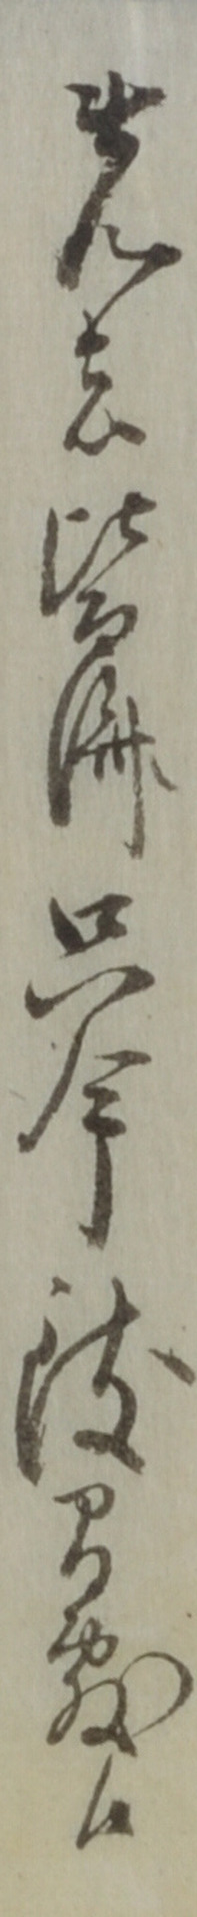先は皆済只今致間敷候
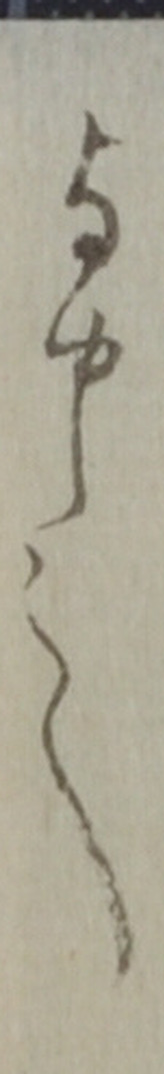と申之
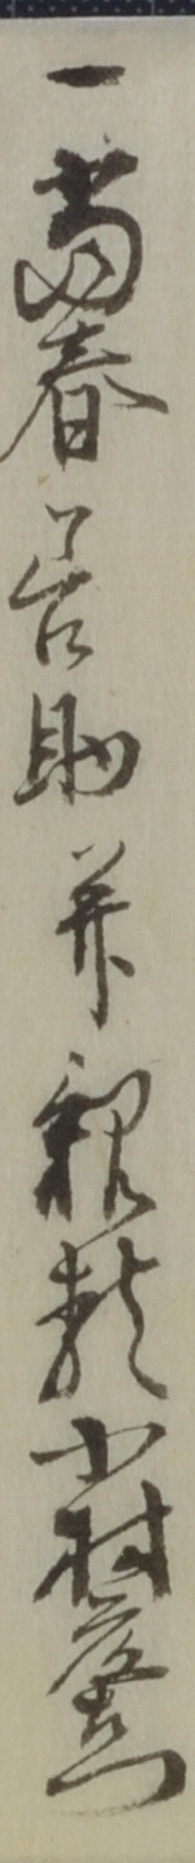一当春善助幷親類小村藤右衛門
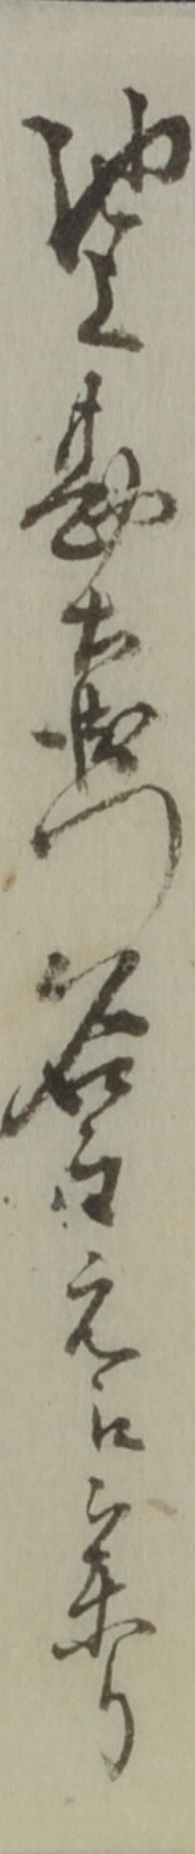池上勘右衛門名主元え参り
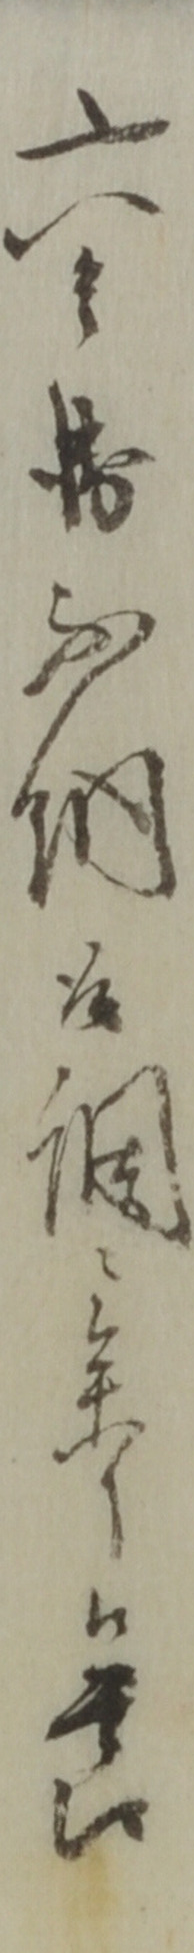六兵衛不納取調に参り候節
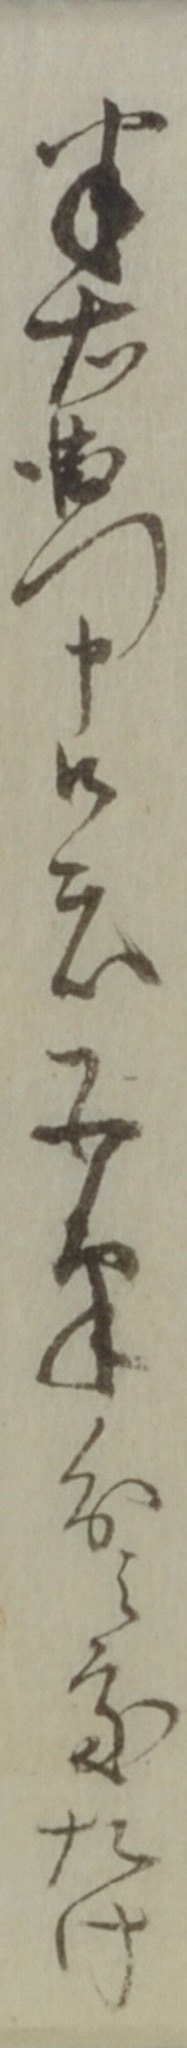半右衛門申候は五筆分之処たけ
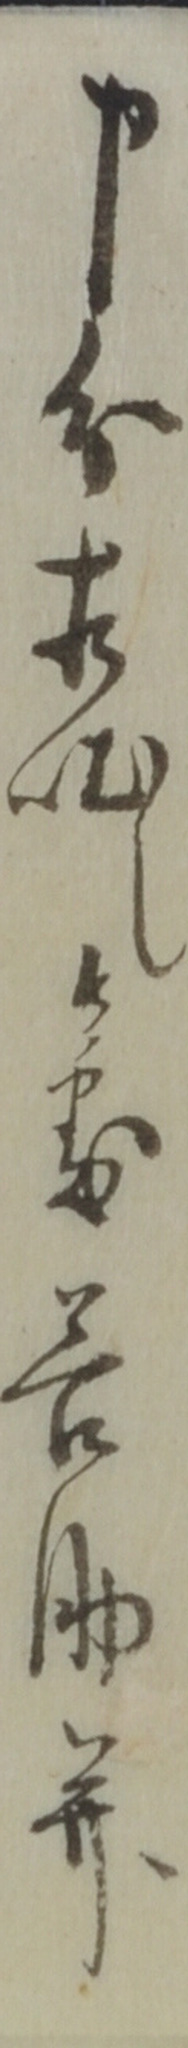申分相咄し候処善助幷
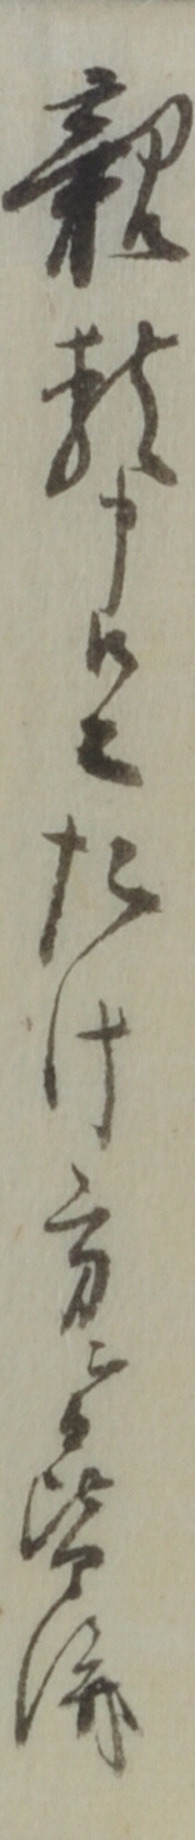親類申候にたけ方にて皆済
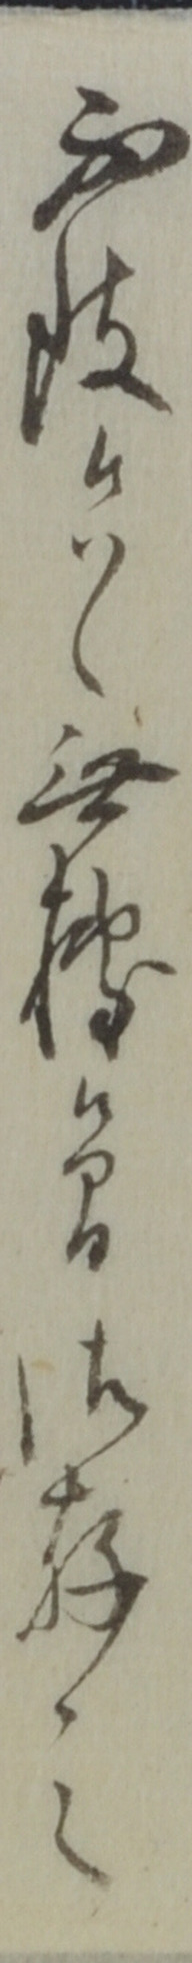不致候はゝ無拠候間御存之
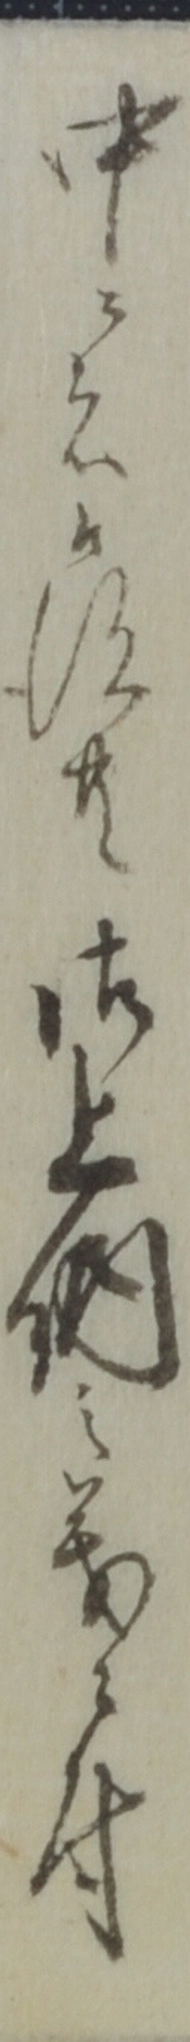中には候得共御上納之儀に付き
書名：口上之覚
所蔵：伊那市立高遠町図書館・合同会社AMANE
